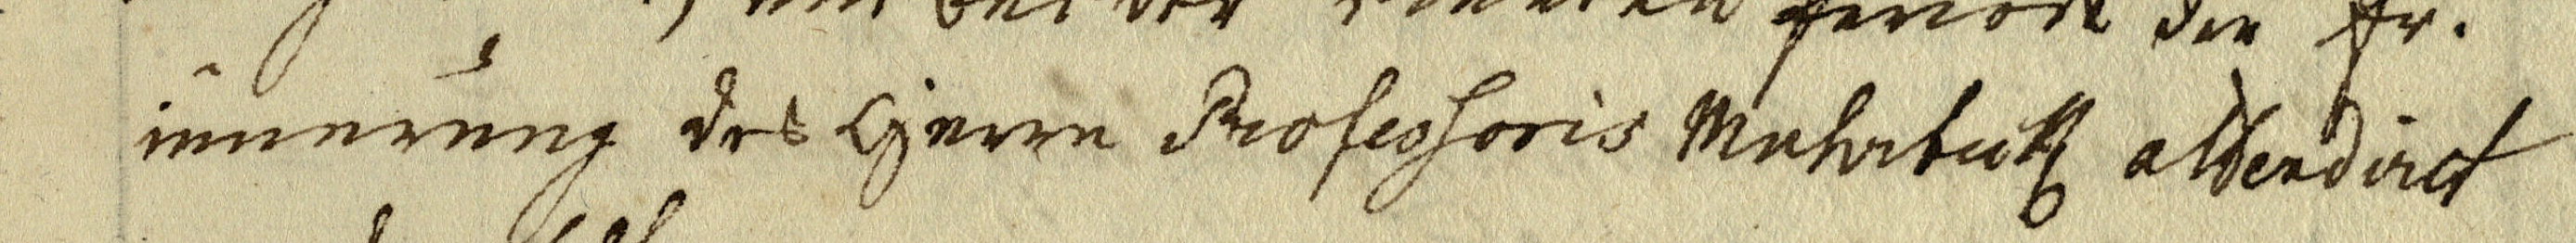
innerung des Herrn Professoris Muhrbeck attendiret
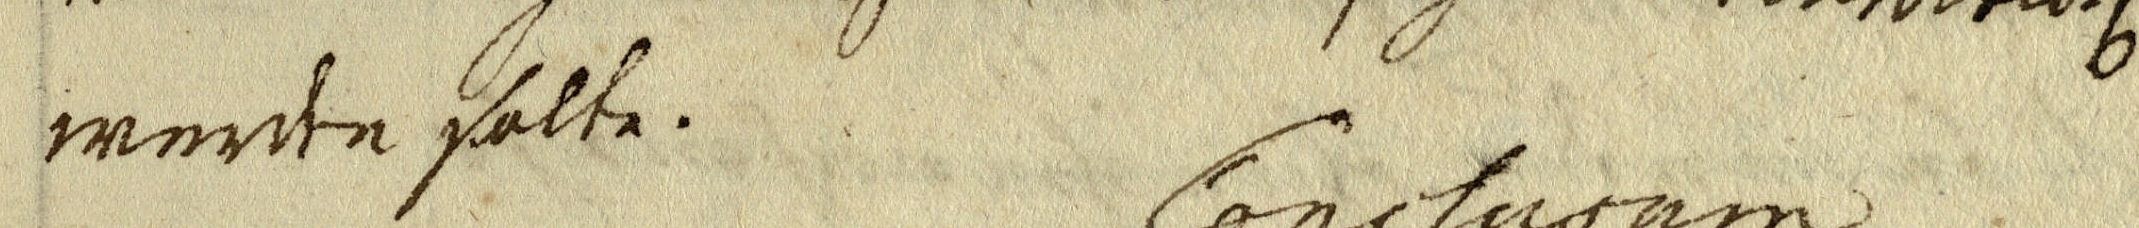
werden solte.
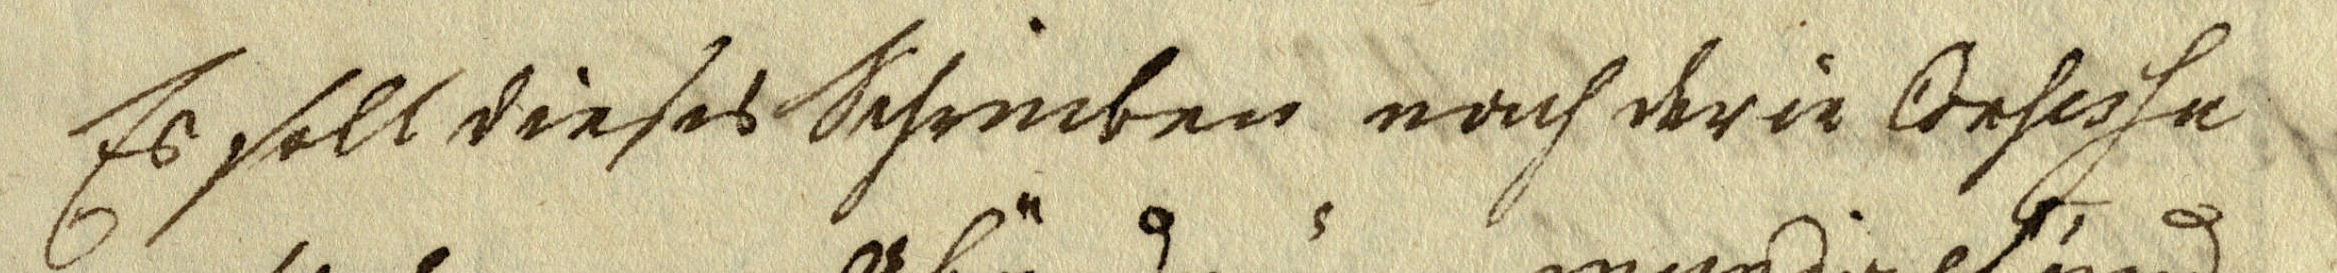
Es soll dieses Schreiben nach der in Consessu
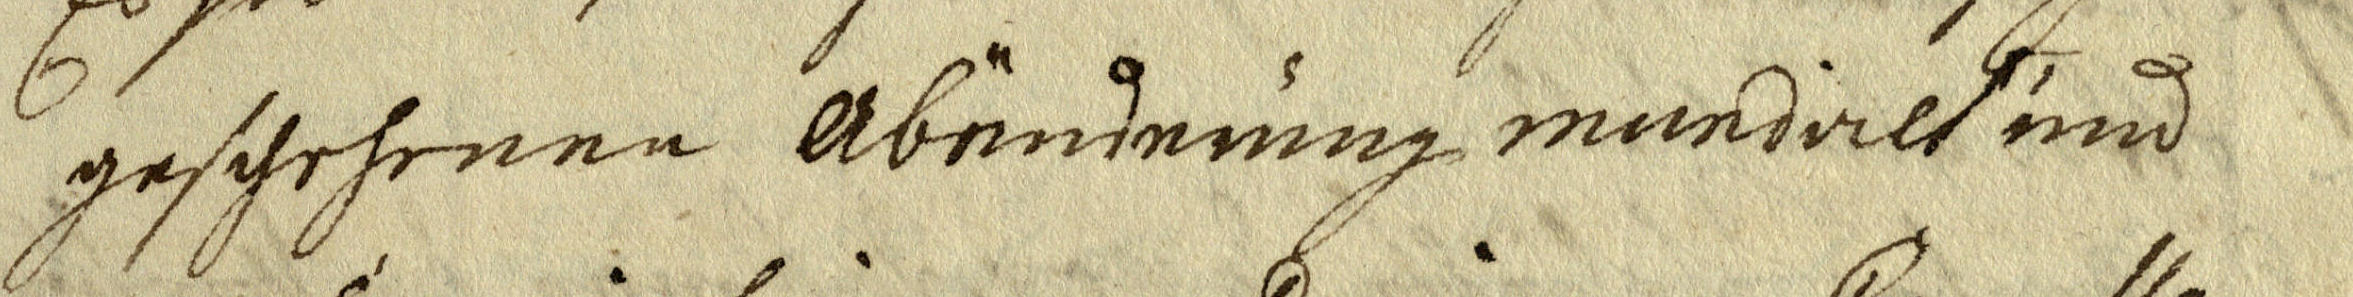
geschehenen Abänderung mundiret und
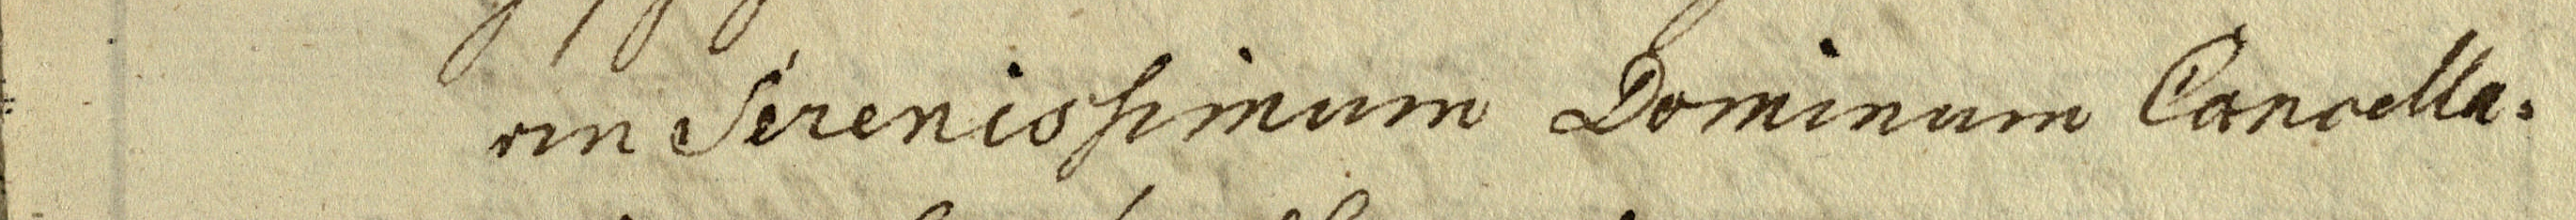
an Serenissimum Dominum Cancella¬
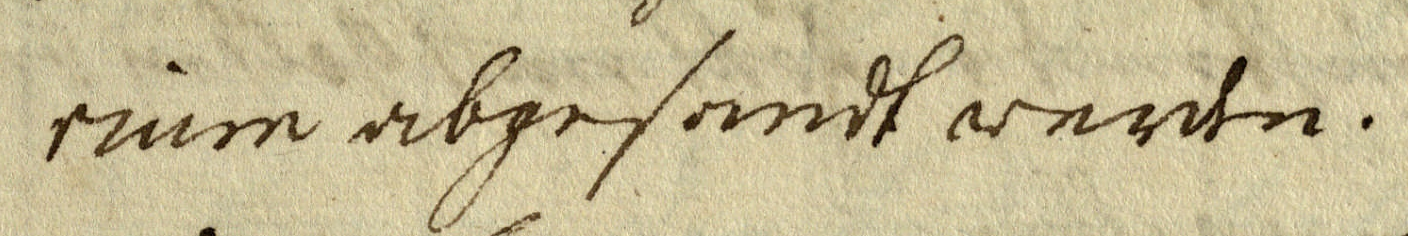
rium abgesandt werden.
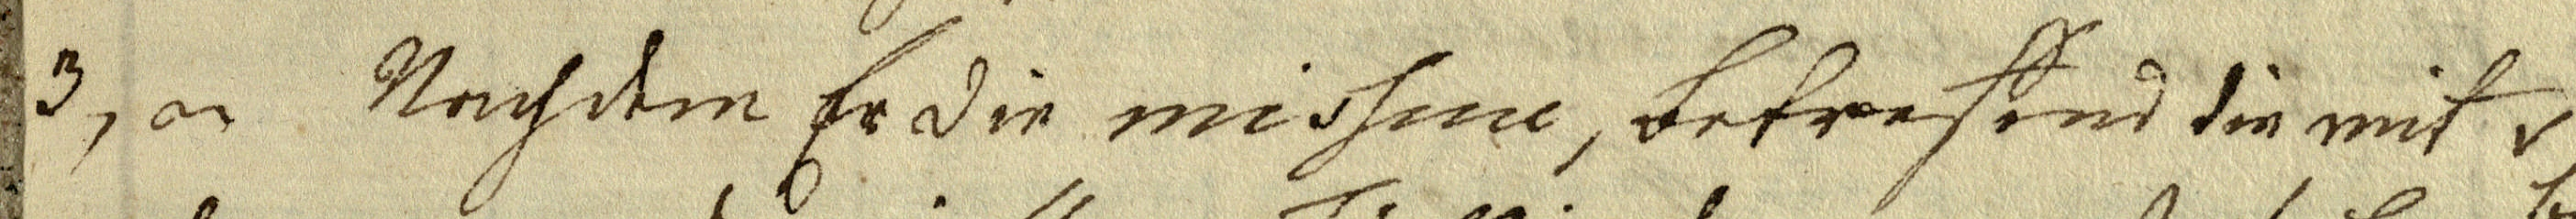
3. Nachdem er die missine, betreffend die mit
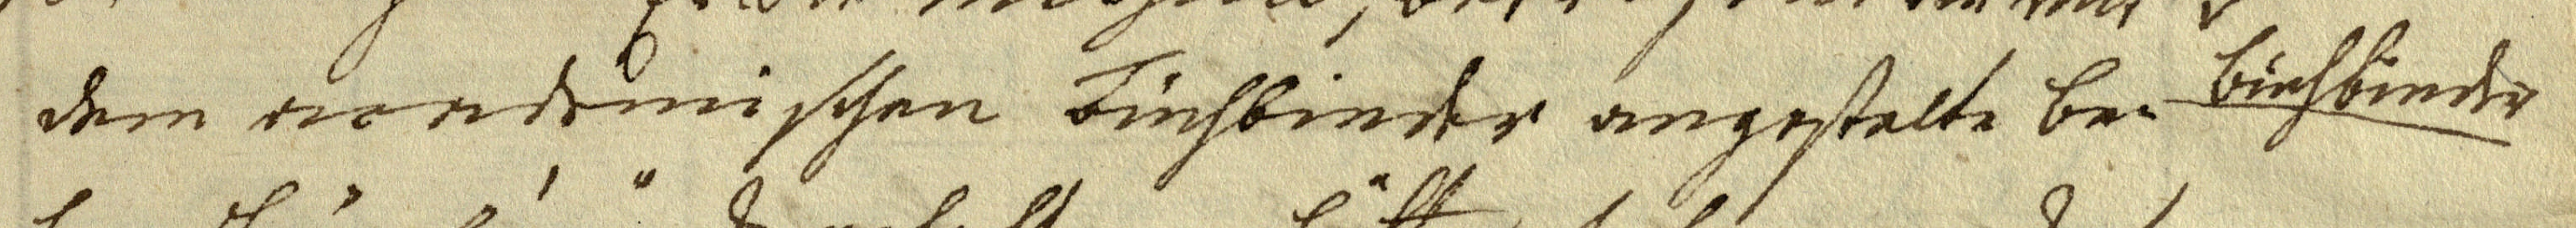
dem academischen Buchbinder angestelte be- Buchbinder
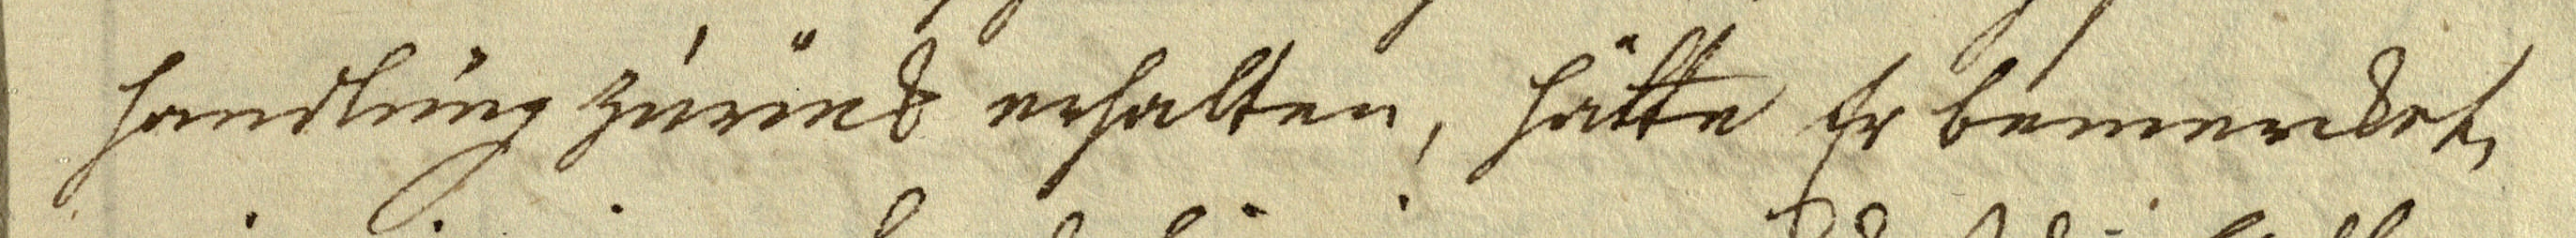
handlung zurück erhalten, hätte Er bemercket,
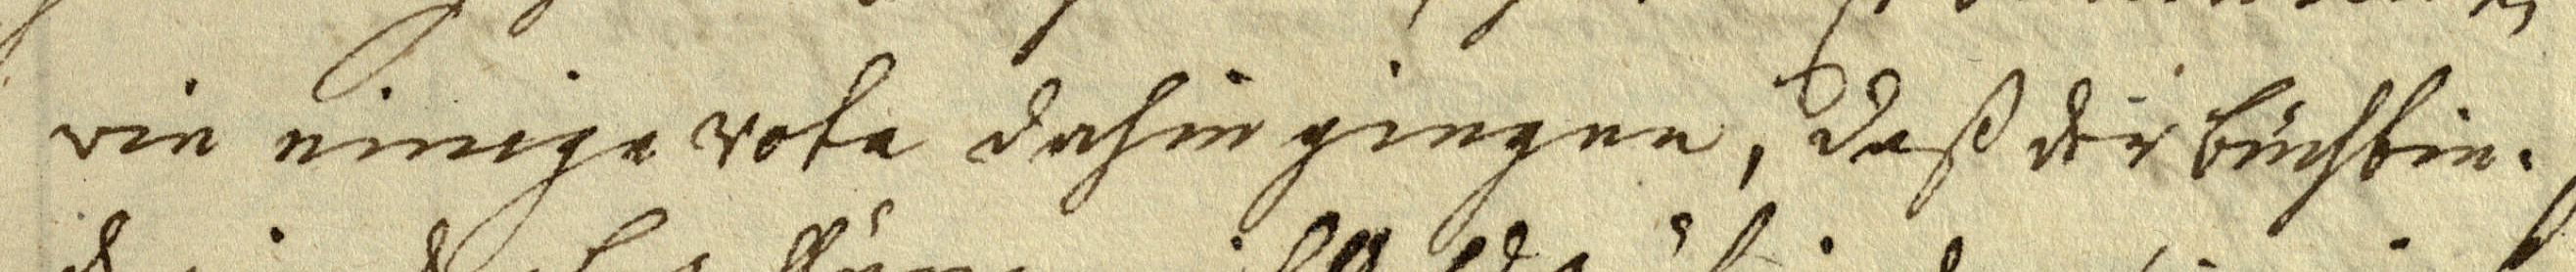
wie einige vota dafür gingen, daß der Buchbin¬
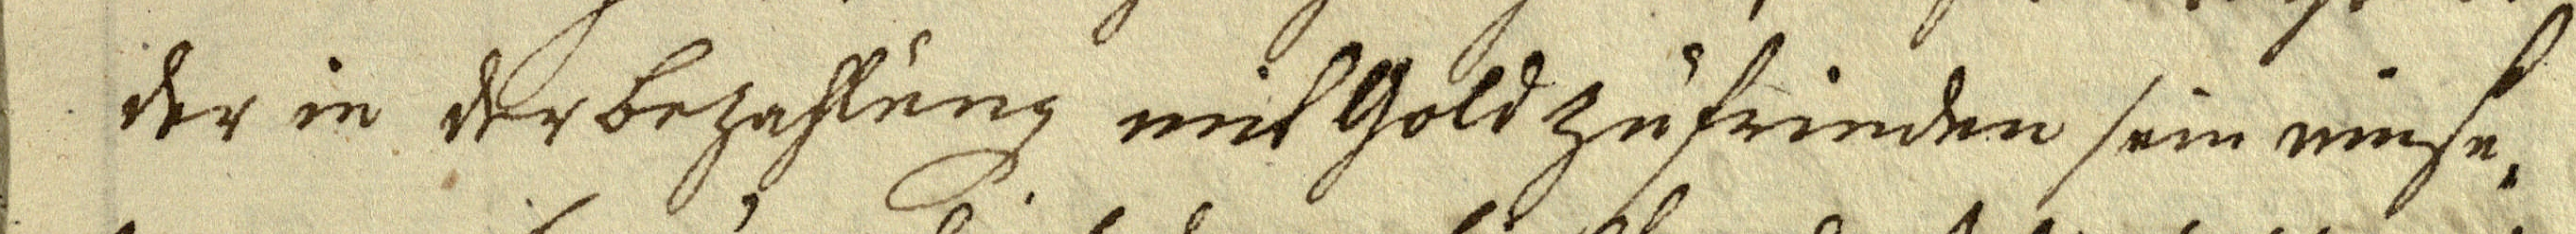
der in der Bezahlung mit Gold zufrieden sein müße,
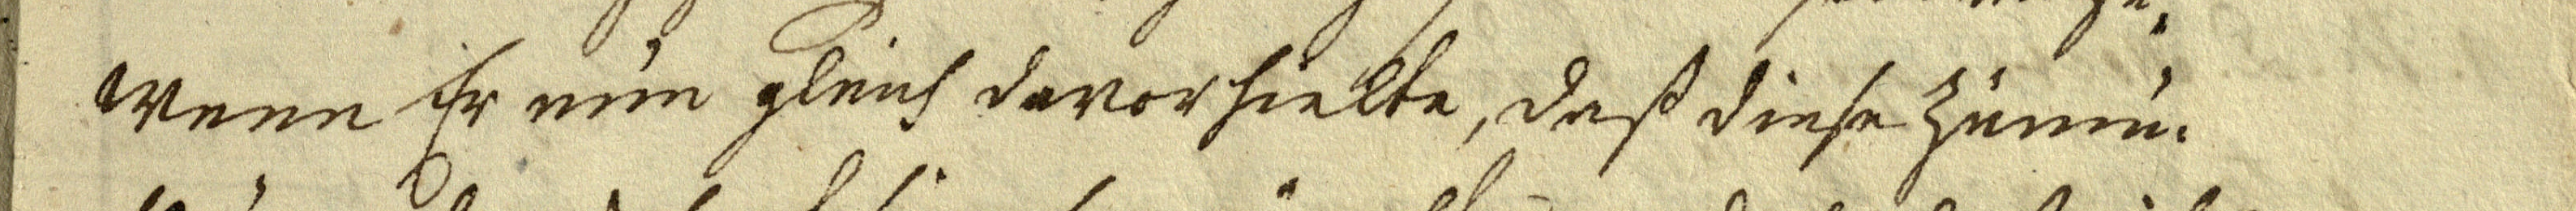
wenn Er nun gleich davor hielte, daß diese Zumu¬
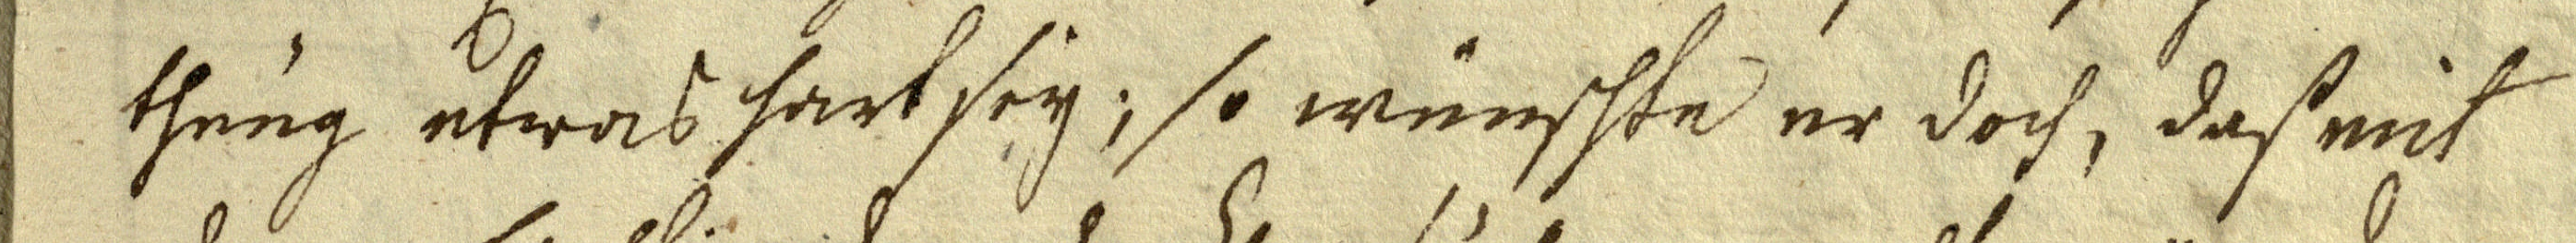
thung etwas hart seÿ; so wünschte er doch, daß mit
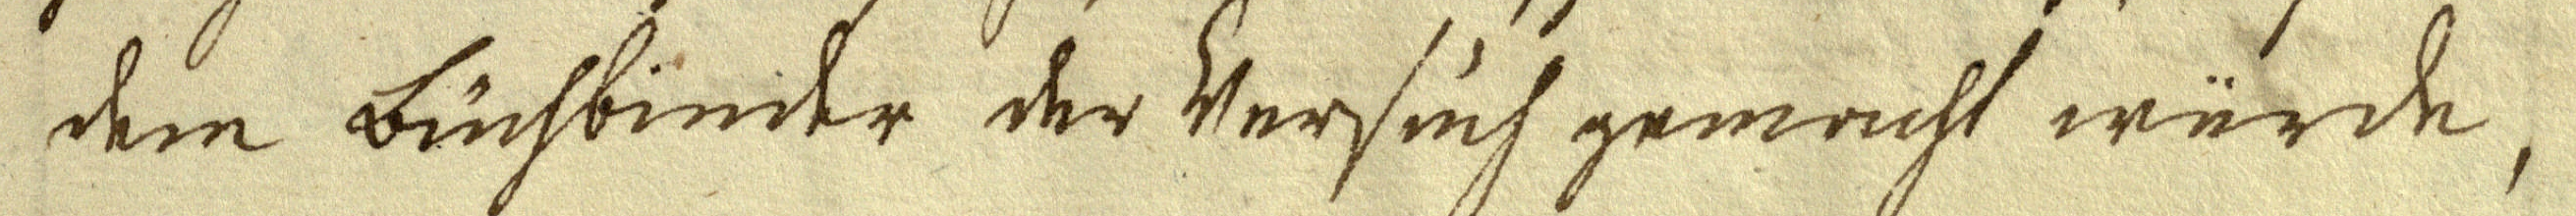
dem Buchbinder der Versuch gemacht würde,
